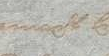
gemacht werden
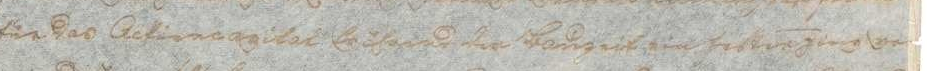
für das Actiencapital während der Bauzeit ein fester Zins von
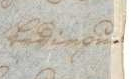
gleichen
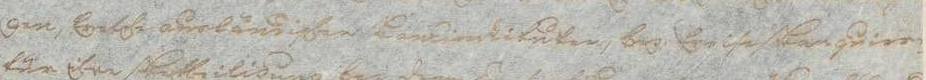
gen, welche ausländischen Bankinstituten, bez.weise Banquiers
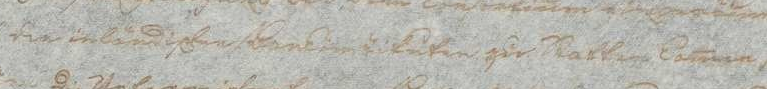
auch den inländischen Bankinstituten zu Statten kommen sollen,
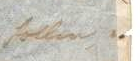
kläre die
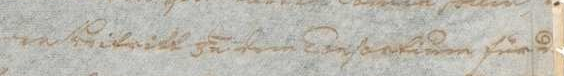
den Beitritt zu dem Consortium für die
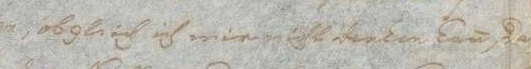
sage, obgleich ich mir nicht denken kann, daß
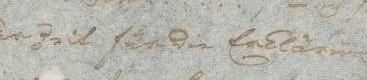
zur Zeit für die Erklärung
